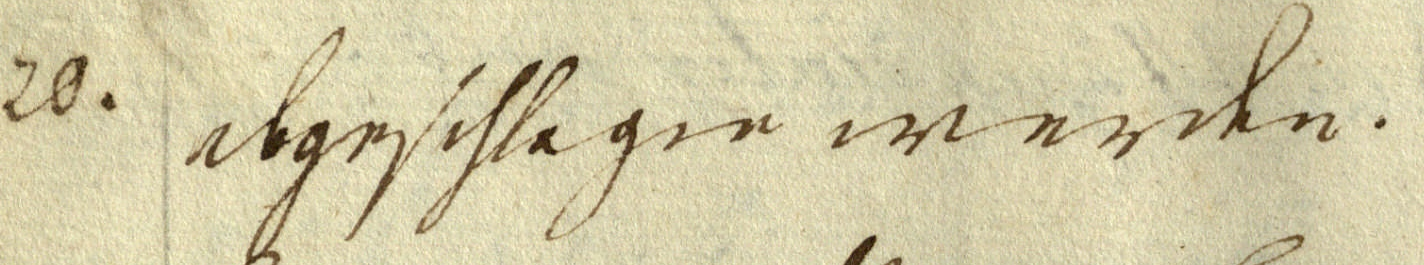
abgeschlagen werden.
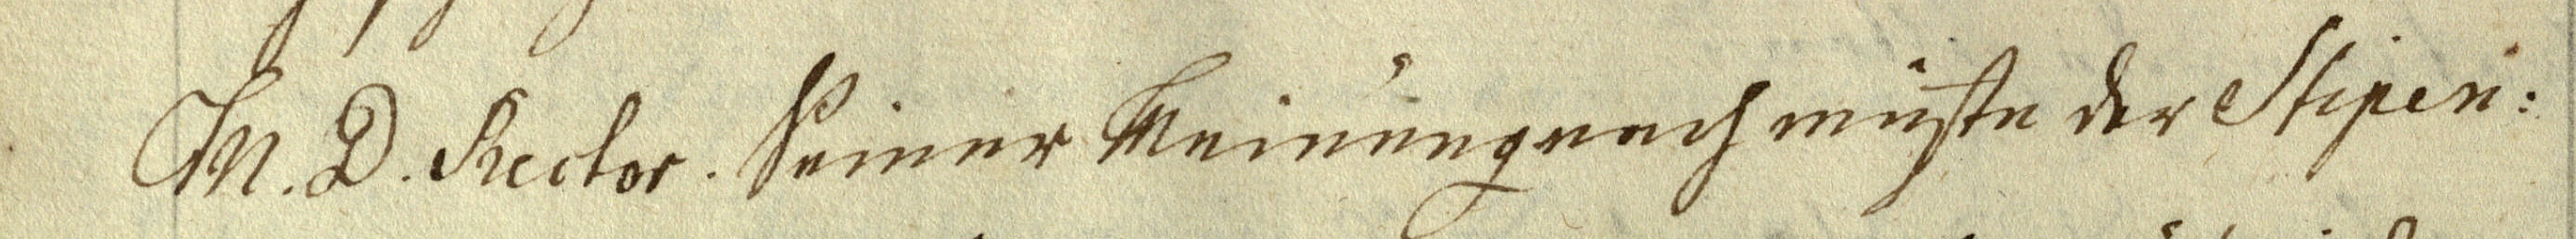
M. D. Rector. Seiner Meinung nach müßte der Stipen¬
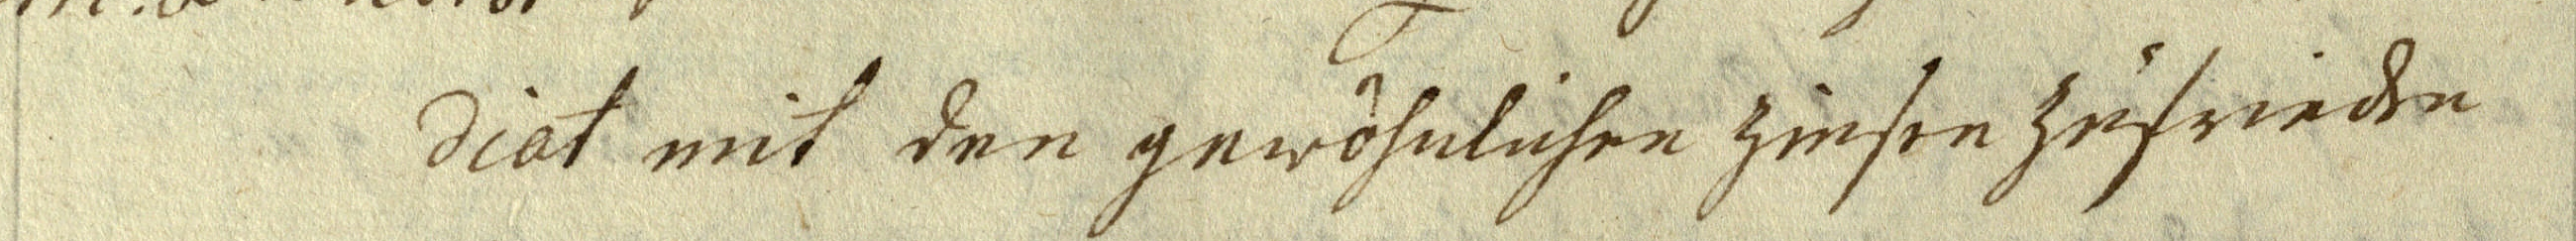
diat mit den gewöhlichen Zinsen zufrieden
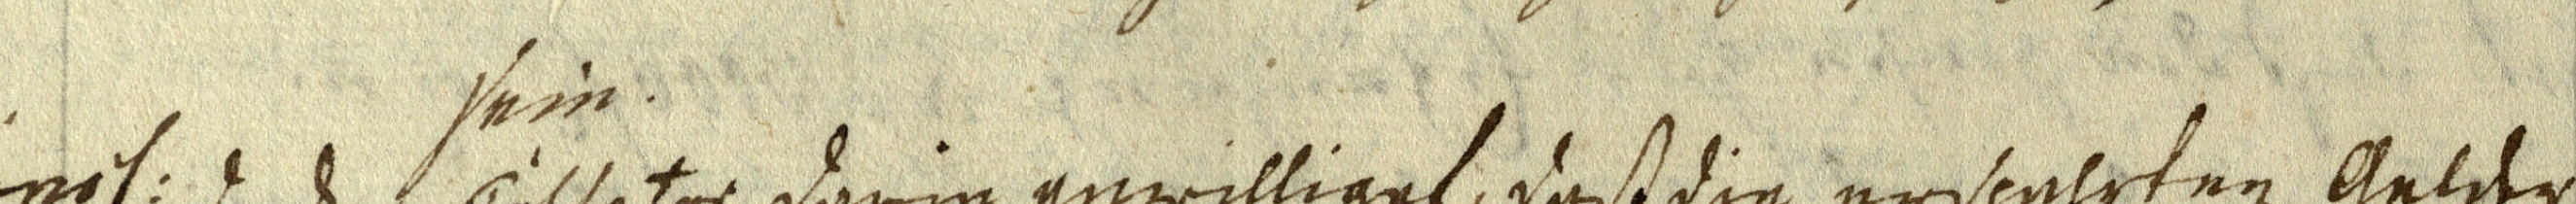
sein.
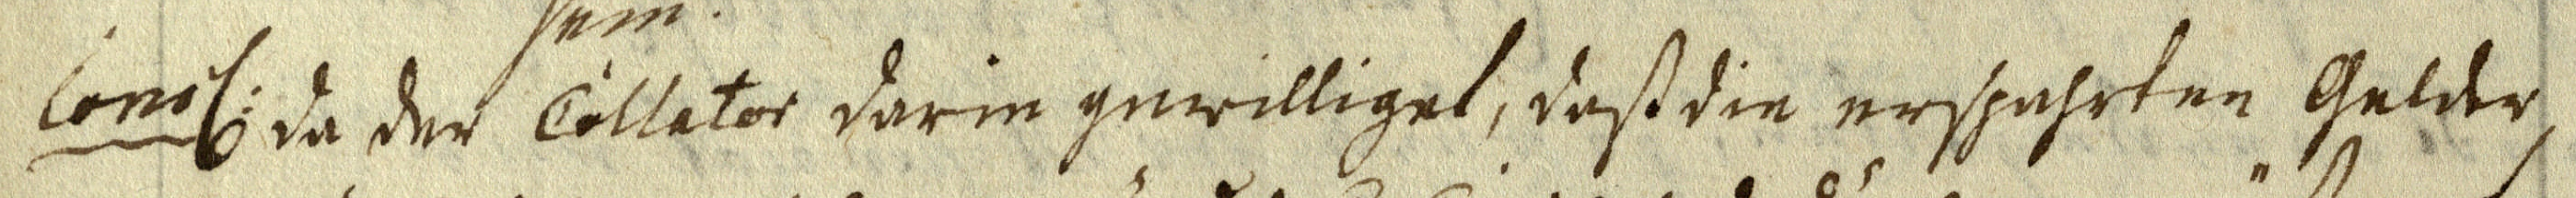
Concl: da der Collator darin gewilliget, daß die erspahrten Gelder
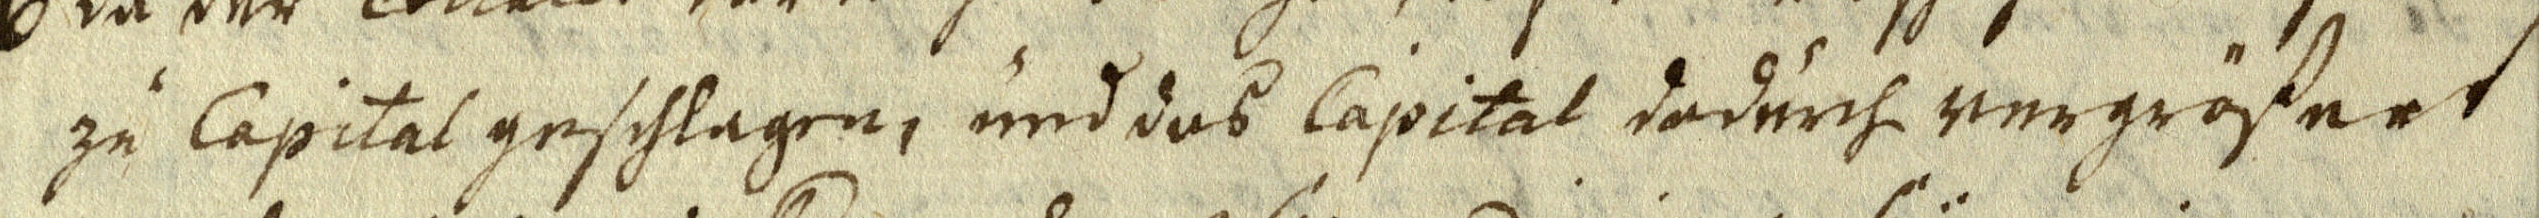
zu Capital geschlagen, und das Capital dadurch vergrößert
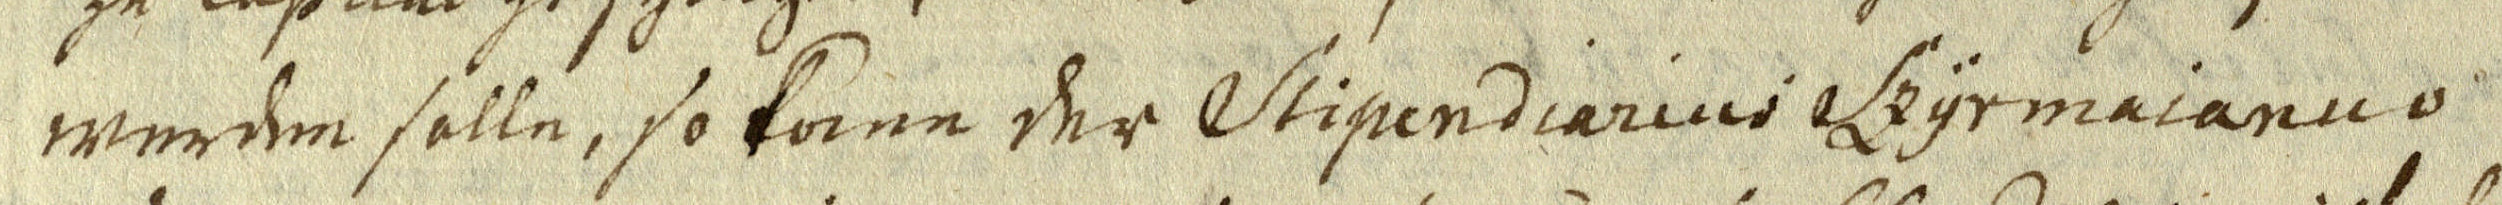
werden solle, so kann der Stipendiarius Szÿrmaianus
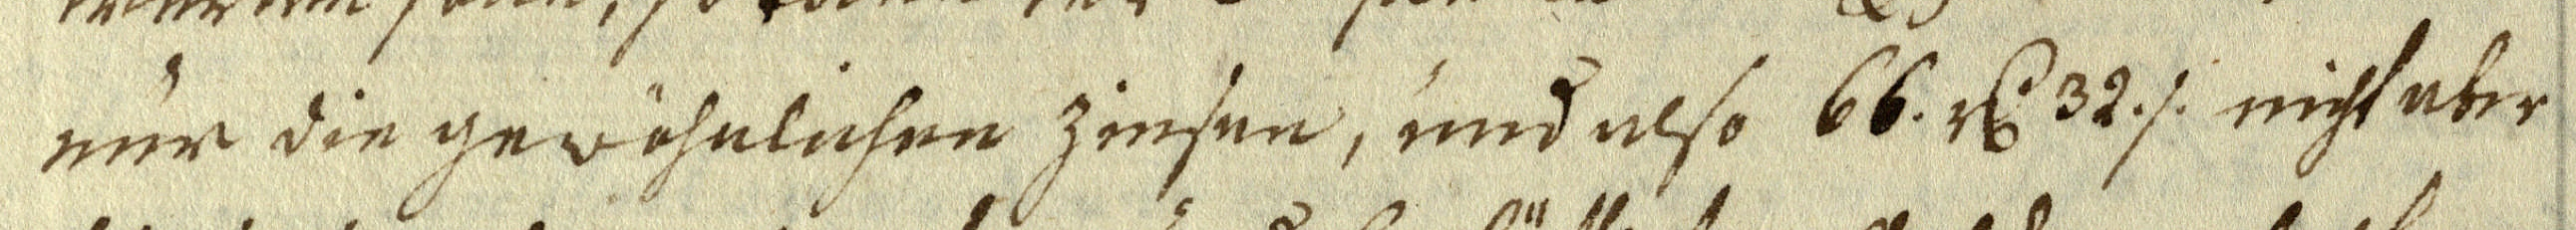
nur die gewöhnlichen Zinsen, und also 66. r 32.s. nicht aber
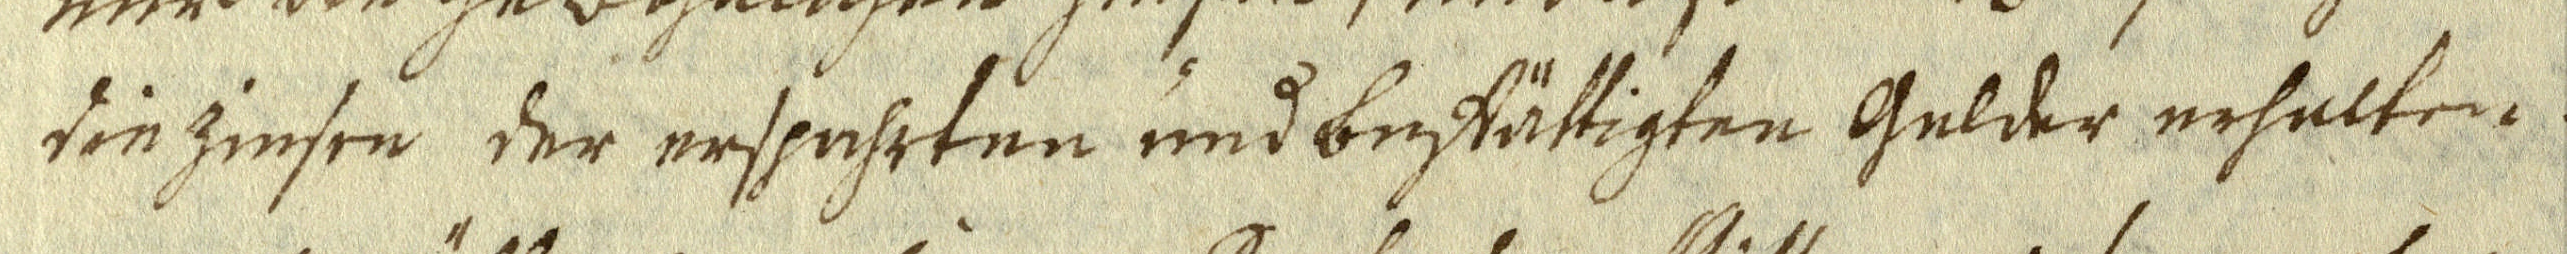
die Zinsen der erspahrten und bestättigten Gelder erhalten.
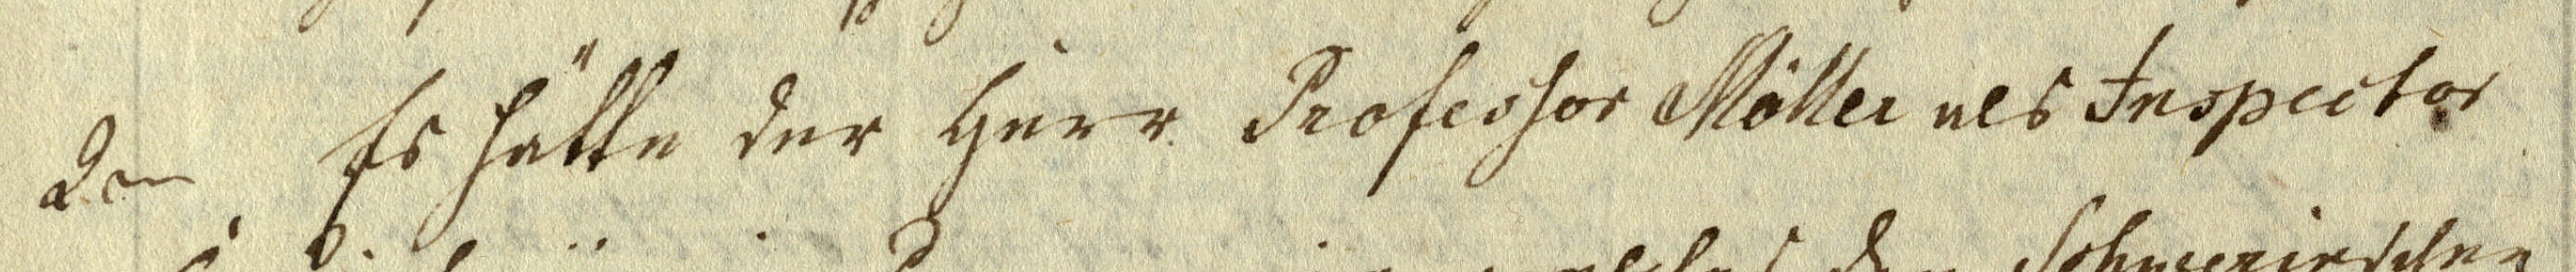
2. Es hätte der Herr Professor Möller als Inspector
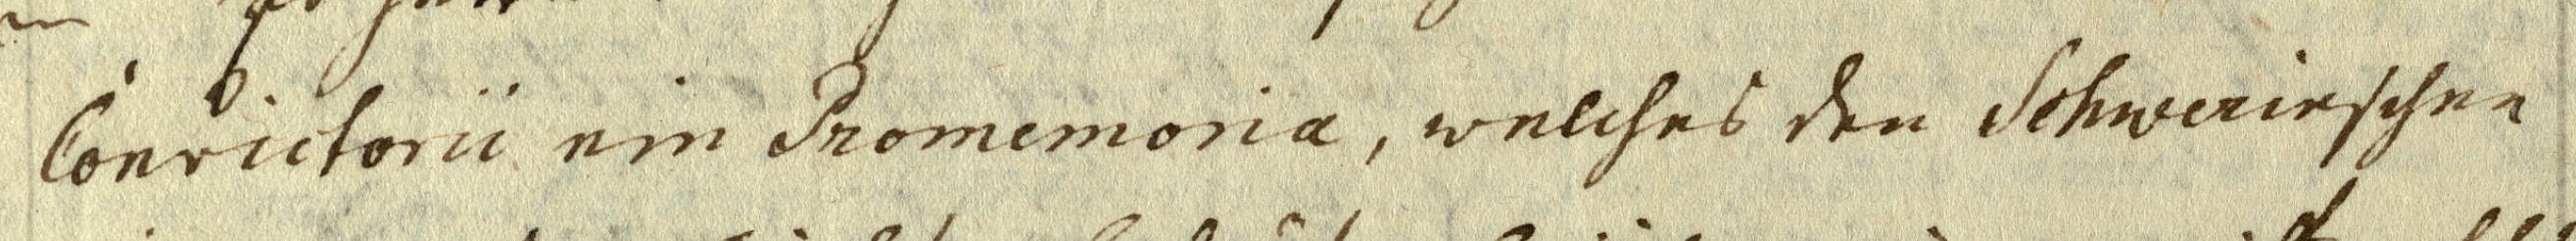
Convictorii ein Promemoria, welches den Schwerinschen
